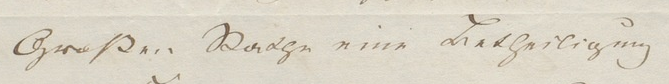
Großen Rathe eine Betheiligung
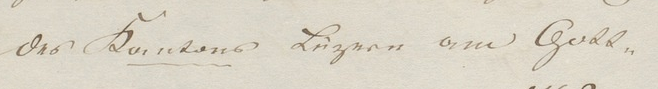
des KantonsLuzern am Gott-
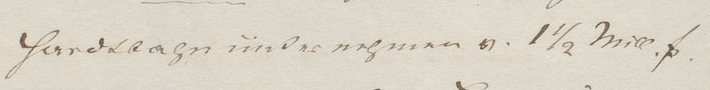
hardtbahnunternehmen v. 1½ Mill. fs.
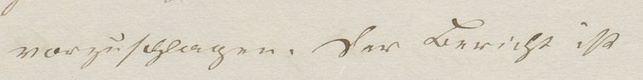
vorzuschlagen. Der Bericht ist
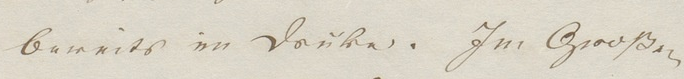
bereits im Druke. Im Großen
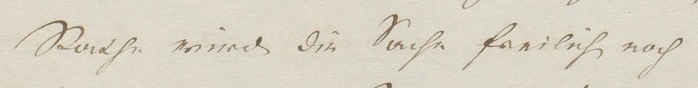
Rathe wird die Sache freilich noch
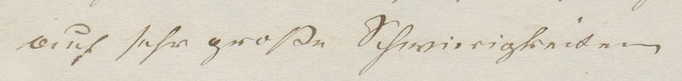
auf sehr große Schwierigkeiten
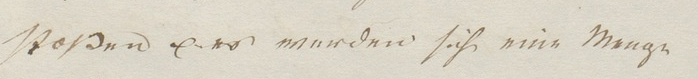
stoßen & es werden sich eine Menge
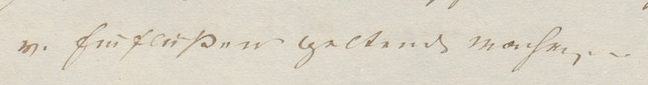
v. Einflüßen geltend machen. –
